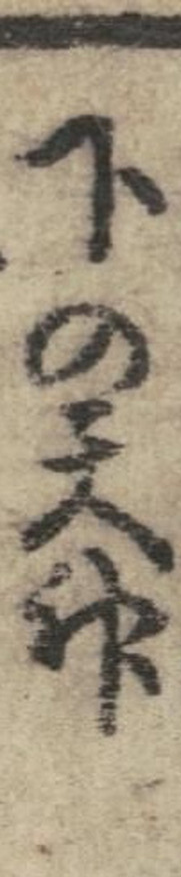中の天神
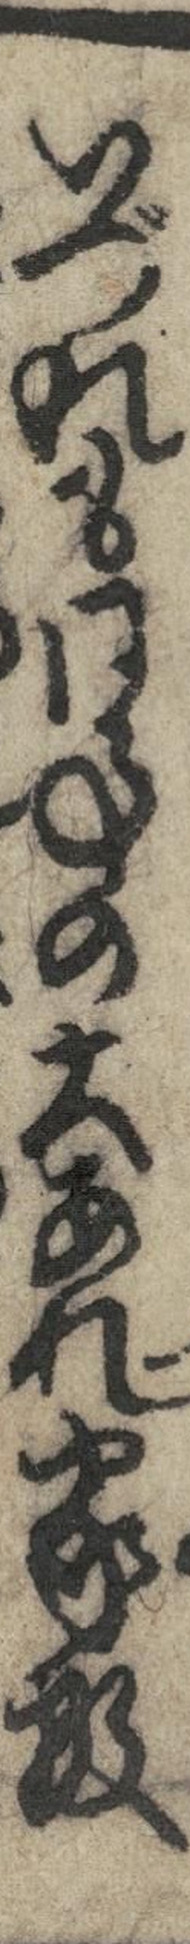いづれも同事の大あれ家数
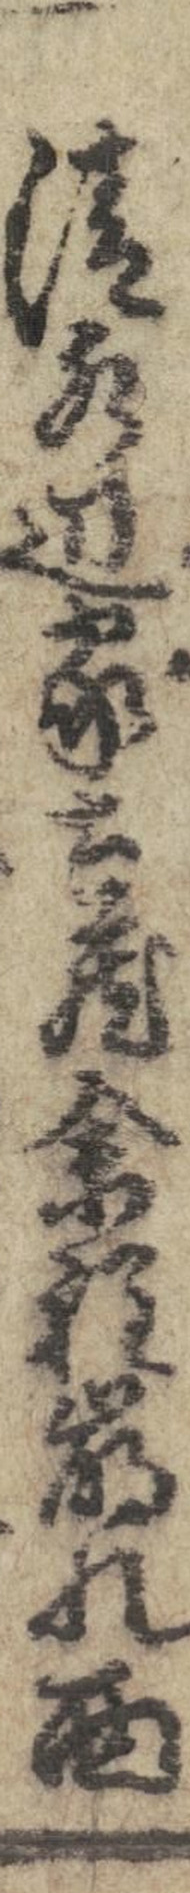清水辺家土蔵余程崩れ西
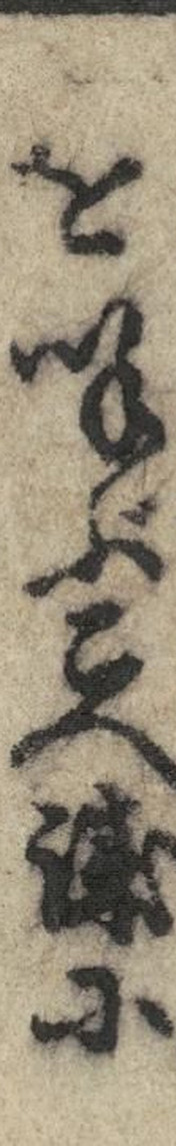を呼ぶこへ誠に
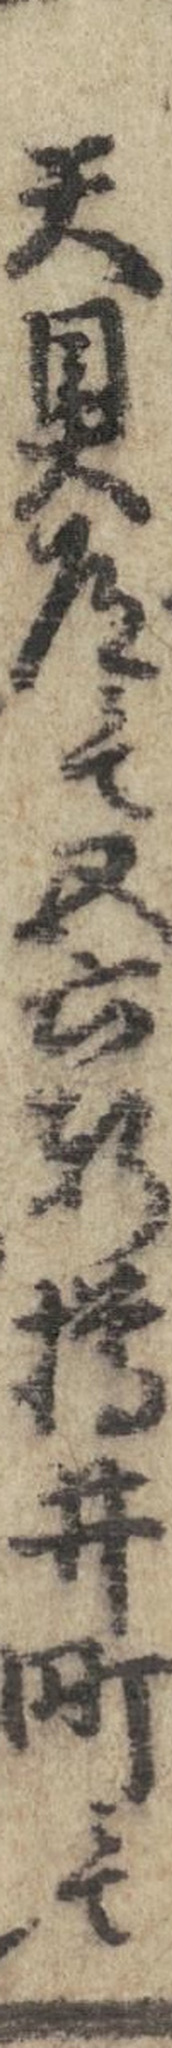天具道ニて五六軒樽井町にて
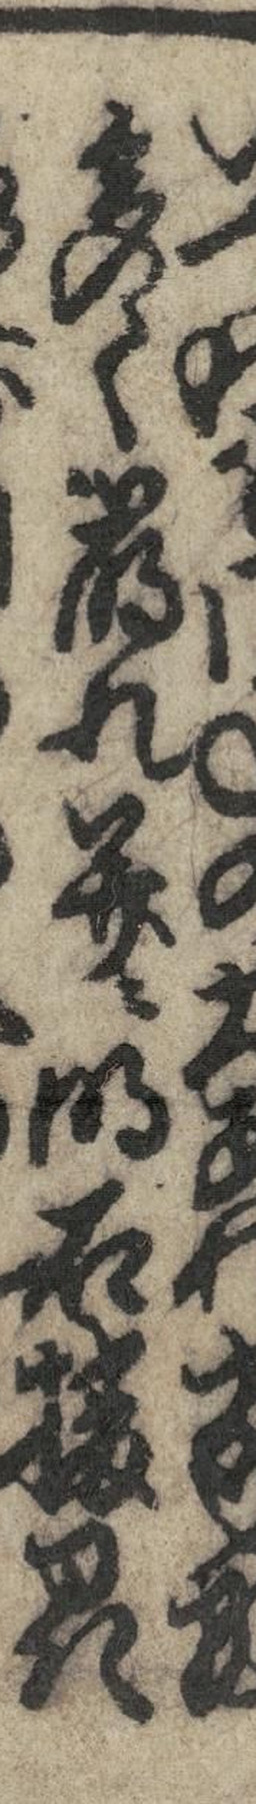多く崩れ幷に明石播州
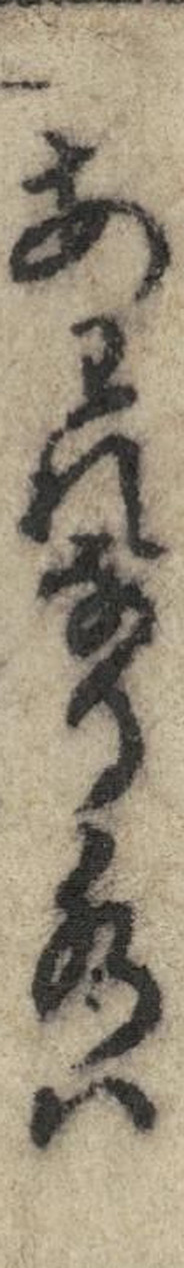あわれなり水は
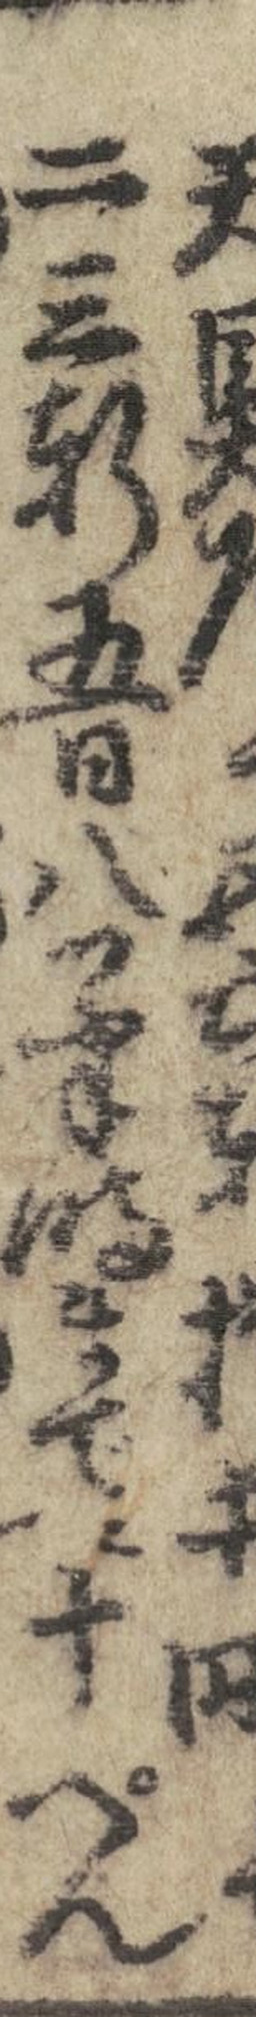二三軒五日八ツ半時までニ十ぺん
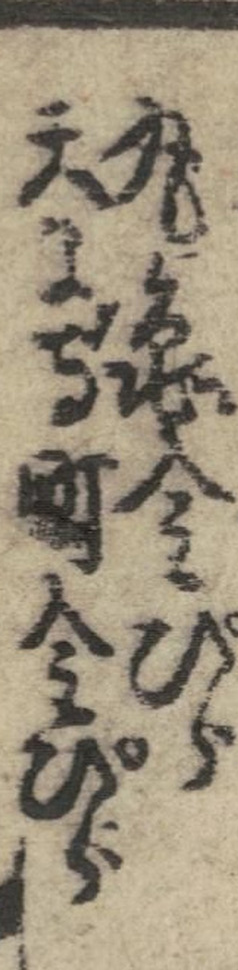天王寺町金ぴら
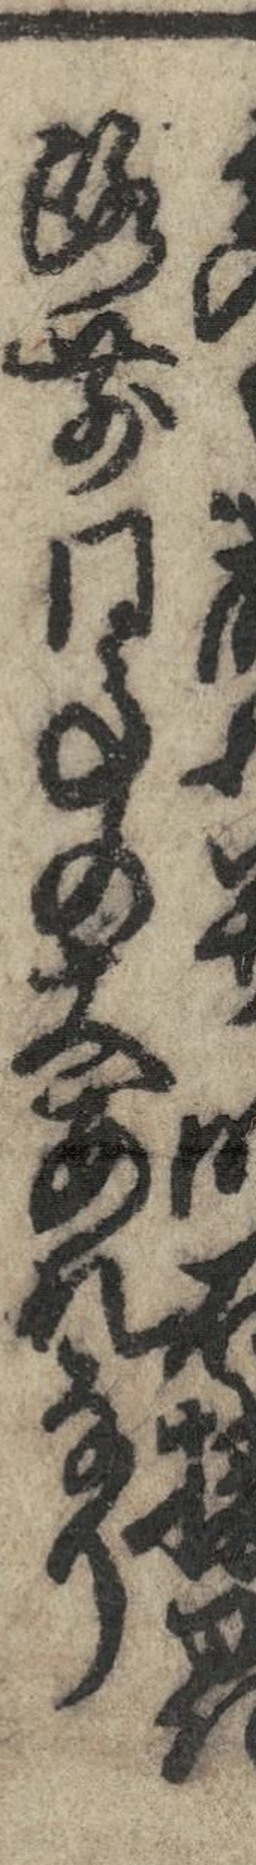路前同事の大あれなり
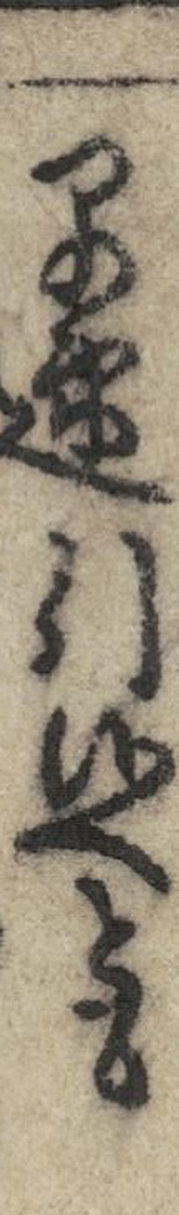早速引候へとも
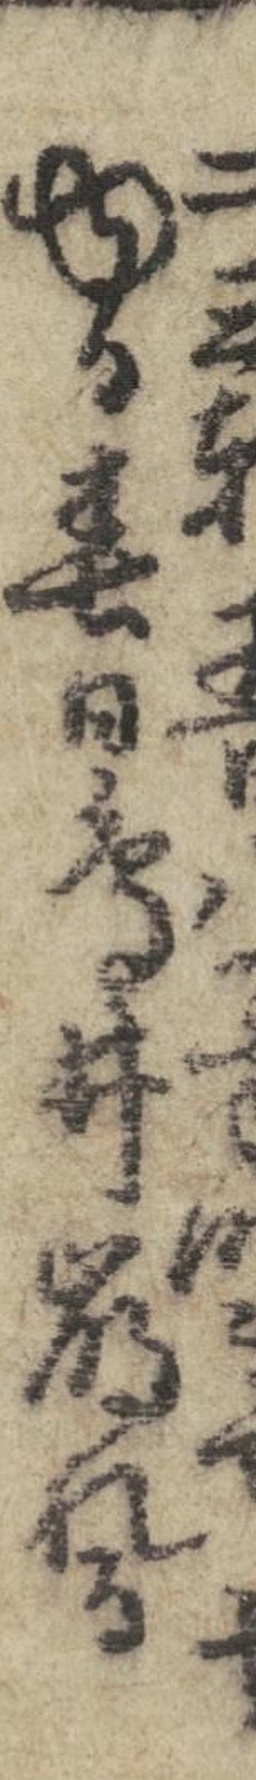ゆる春日鳥井崩れる
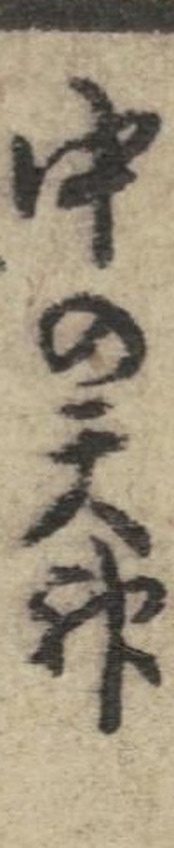中の天神
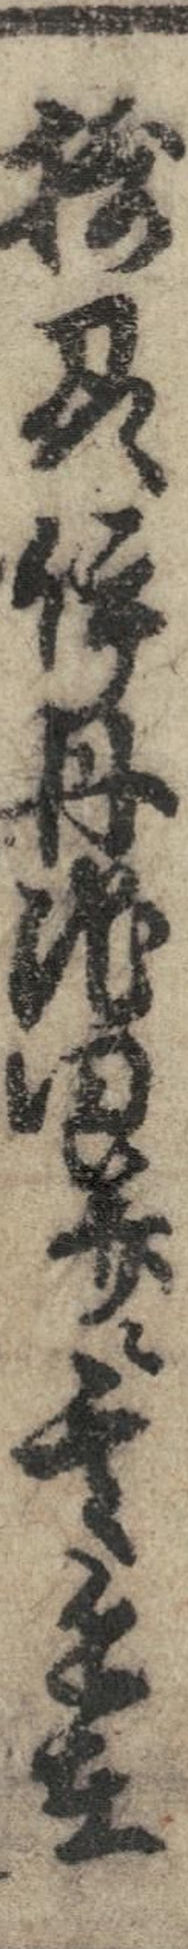播州伊丹池田幷に其近在
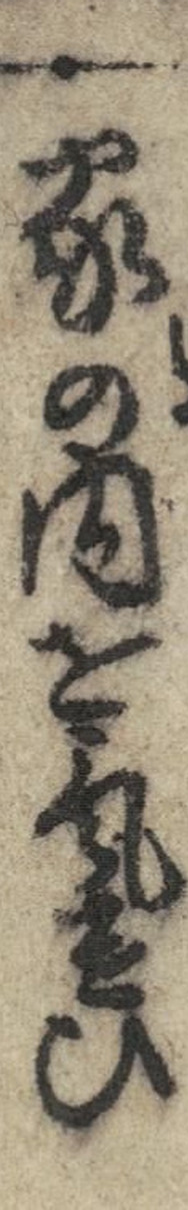家の内を気遣ひ
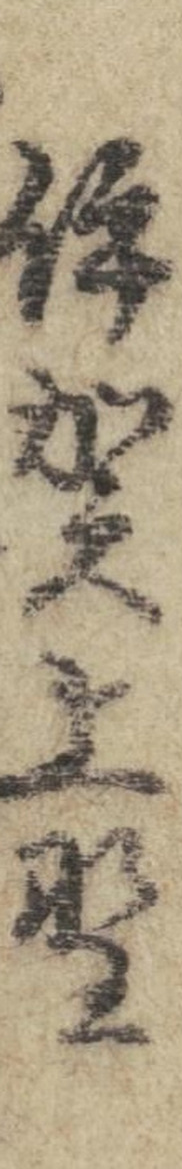伊賀上野
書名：諸国大阪太地震大つなミ末代噺
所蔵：東京大学地震研究所図書室 Earthquake Research Institute Library, The University of Tokyo, JAPAN
